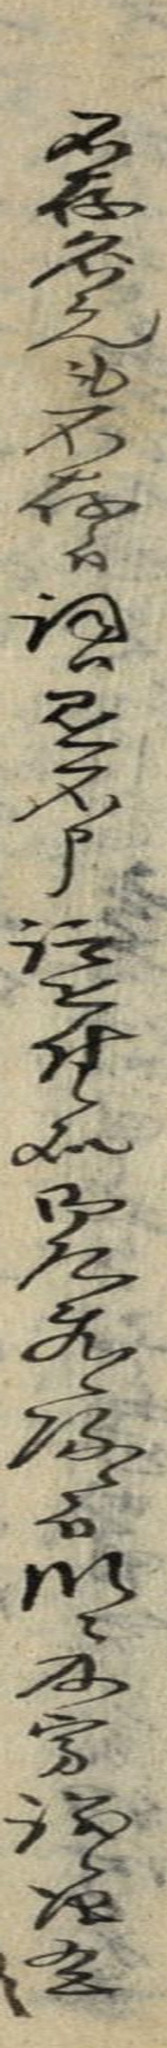不存名元も不存に付詞は懸不申跡を付候処御屋敷へ帰候に付段々及穿議候儀有之
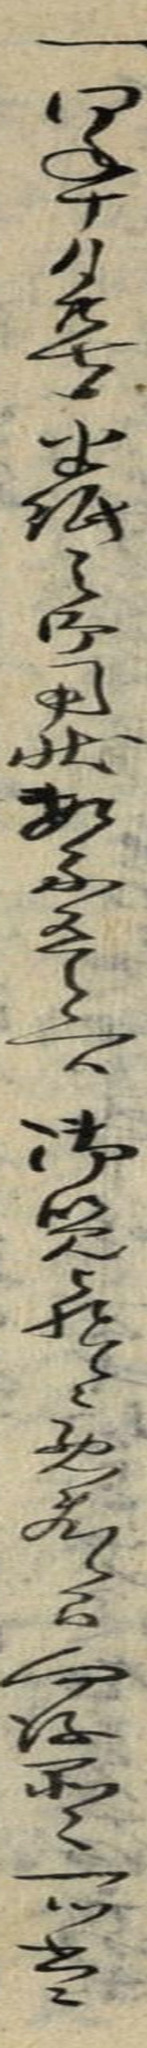一同年十月廿七日半紙之御用状数多有之候へは御覧被遊候に悪敷候間向後品々一ッ書に
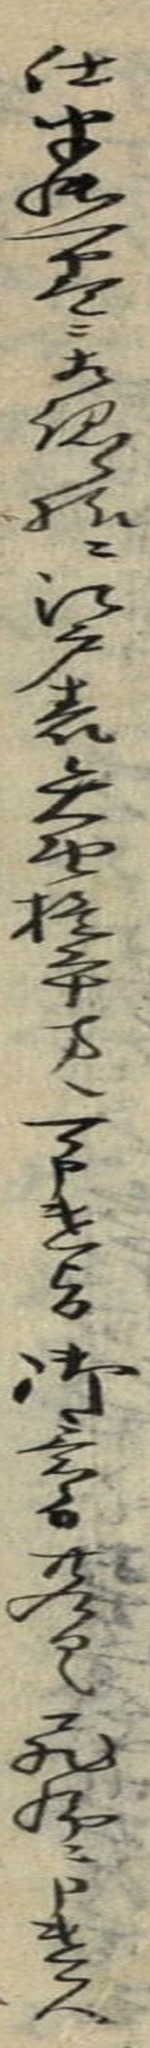仕半紙一巻に相認候様に江戸表矢野権平方へ可申遣旨御意に付廿九日之飛脚に申遣す
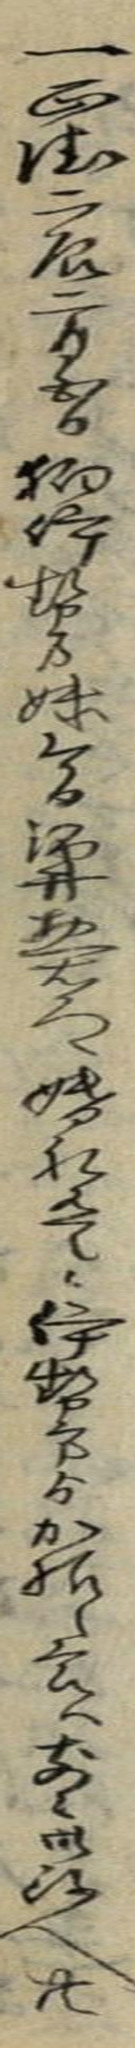一正徳二辰二月五日狛伊勢方妹今日酒井惣右衛門へ婚礼有之候伊勢方ゟか様之節は前々御役人共
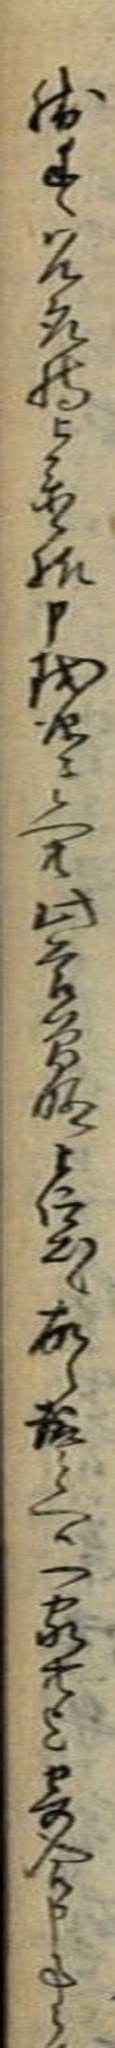勝手へ乍取持被参候様申越儀に候へ共此節簡略被仰出候故之儀に候へゝ一家共迄寄合申事に候
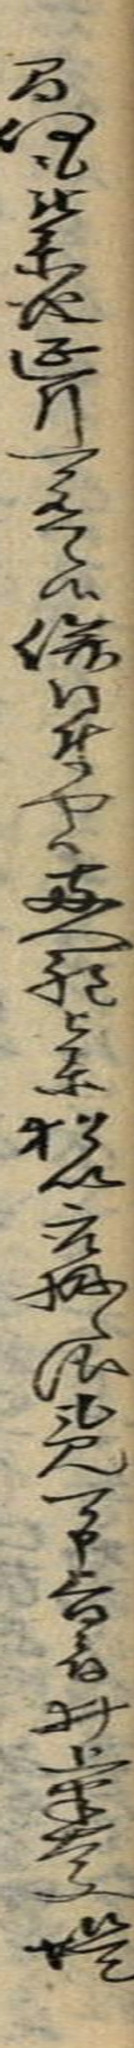間何も被参候儀延引可有之候併目付中は両人程被参猶以取扱候趣等見可申旨に付井上半太夫堤
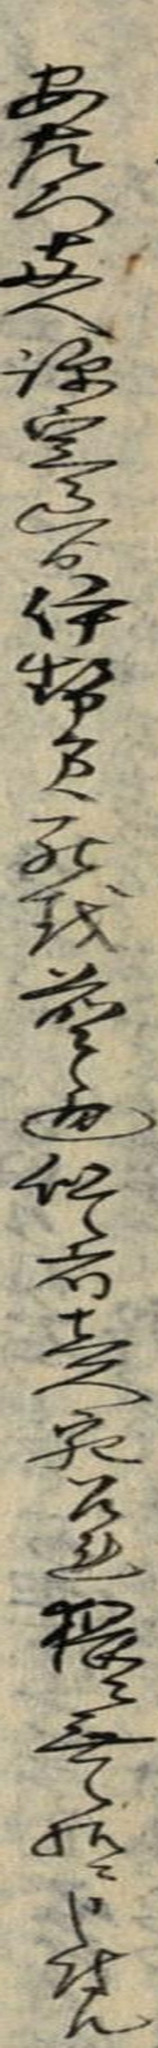安左衛門両人評定過ゟ伊勢方へ罷越前々之通組之者壱人宛召連猥に無之様に申付る
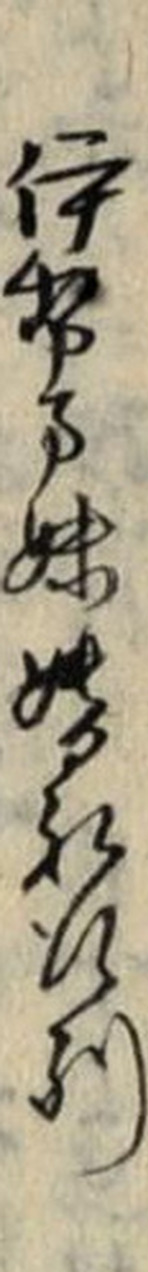伊勢方妹婚例行列
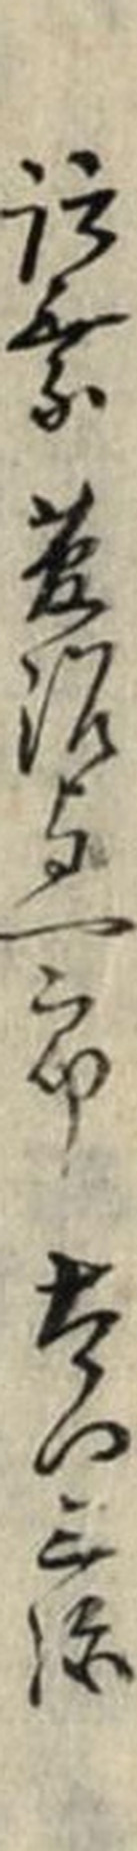跡乗菅沼与一郎太田三弥
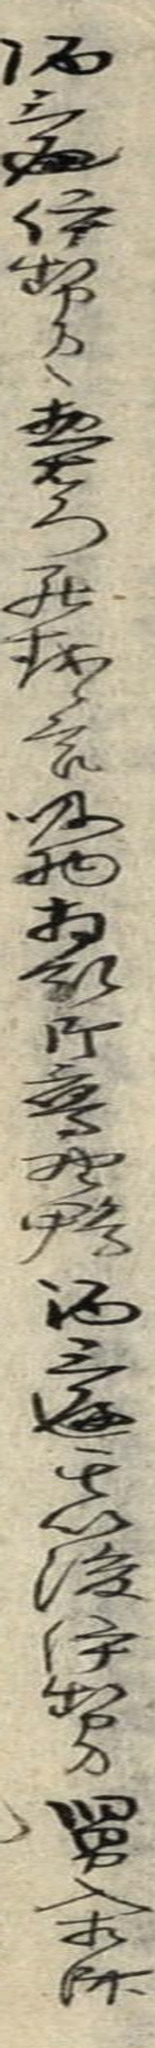酒三通伊勢方へ惣右衛門罷越候節吸物拝領御鷹野鴨酒三通其以後伊勢方舅入相済
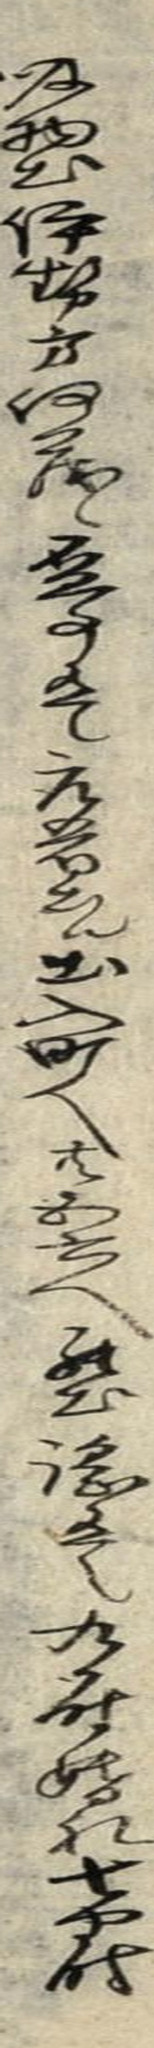吸物出伊勢方何も盃事有之取肴出る出入町人共五六人罷出謡有之九ッ時婚礼七半時
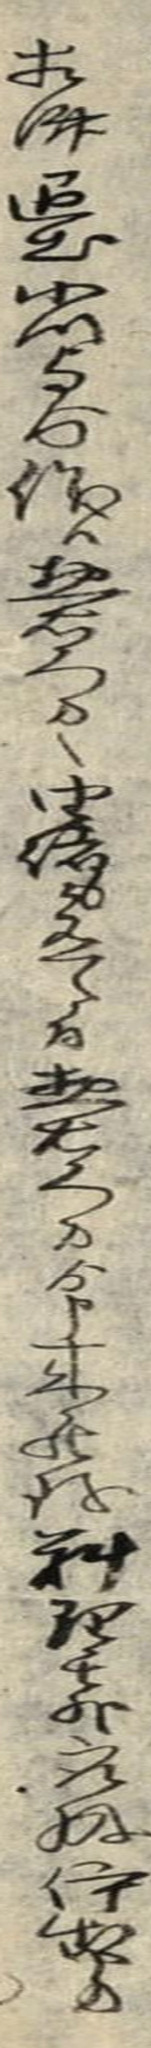相済退出小川与右衛門儀は惣右衛門方へ由緒も有之候に付惣右衛門方ゟ申来罷越料理其外取扱伊勢方
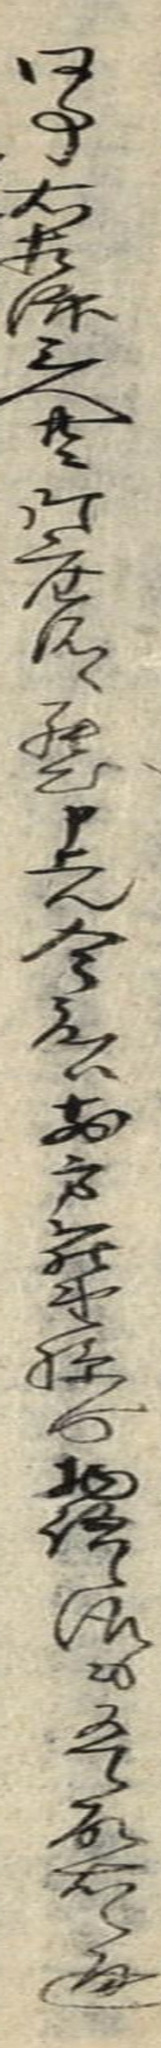同事右相済三人共に御座所へ罷出申上る今度は前方荻野孫右衛門物語之趣も有之故右之通
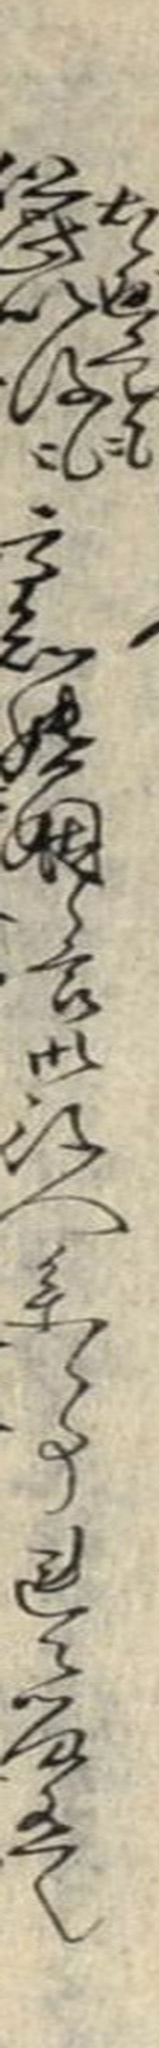但此以後も高知婚姻之節御役人参候事連々留有之
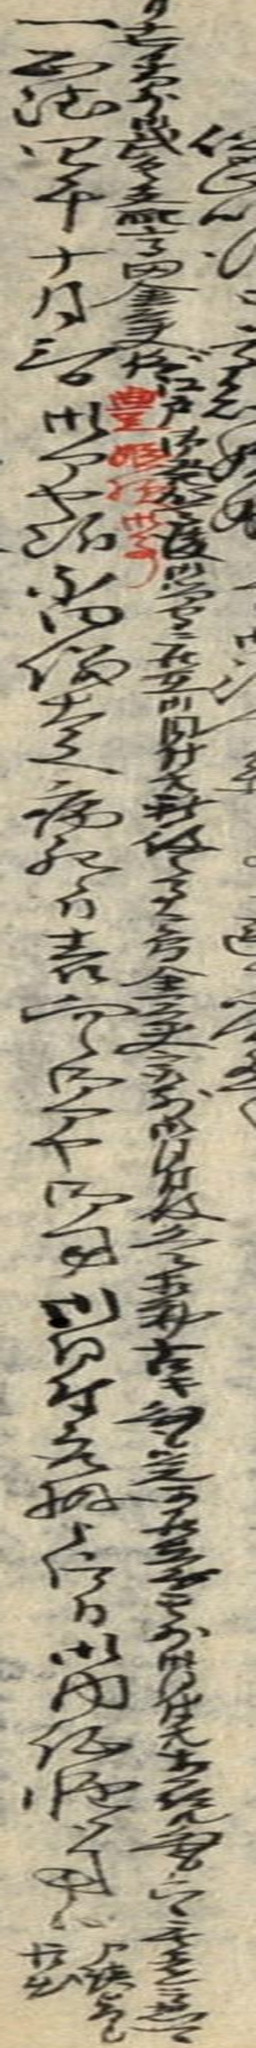一正徳四午十月三日御部屋附永田儀太夫病死に付表向之御部屋御用御目付取扱被仰付御内証軽御用は
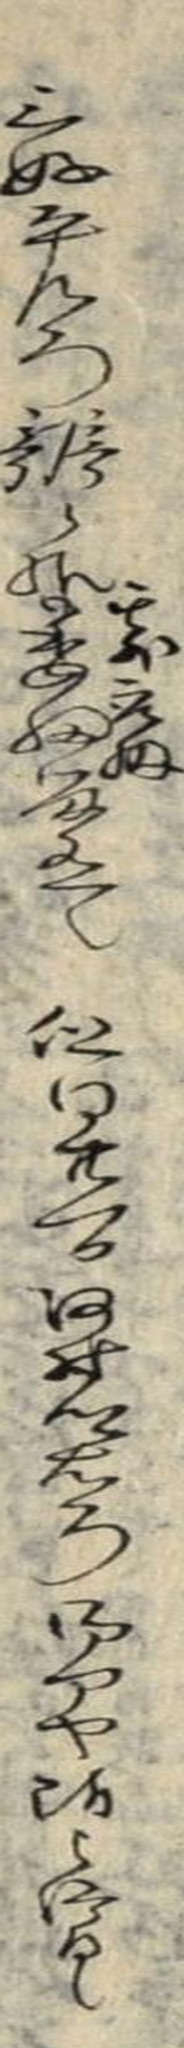三好平左衛門辨候様其外取扱委細留有之但同廿一日河村郷右衛門御部屋附被仰付候
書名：蒐輯之部
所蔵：福井県文書館 Fukui Prefectural Archives
